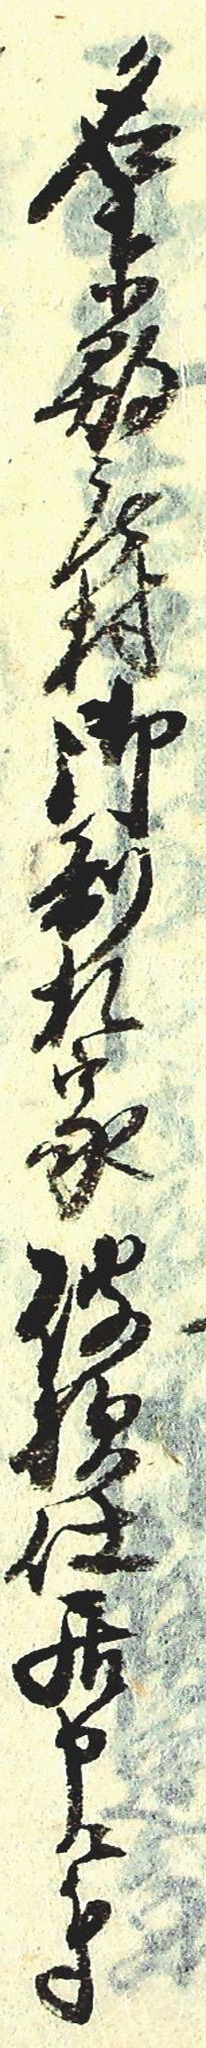名東郡庄村御制札家破損仕居申に付
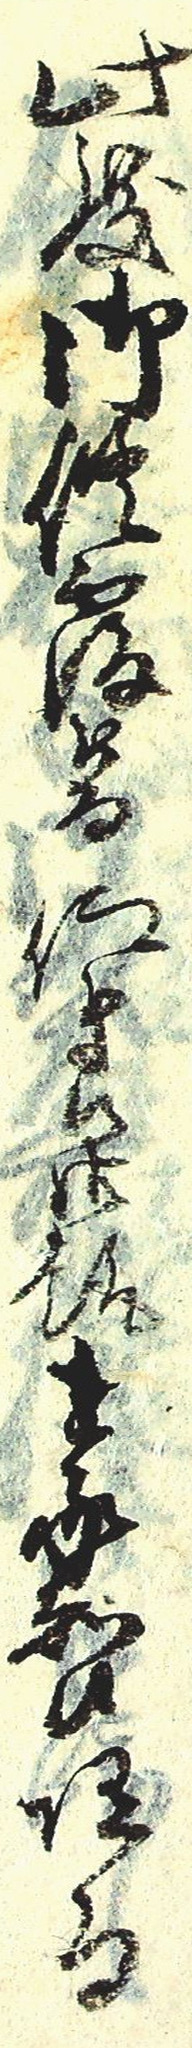此度御修覆被為仰付候御趣奉承知候随て
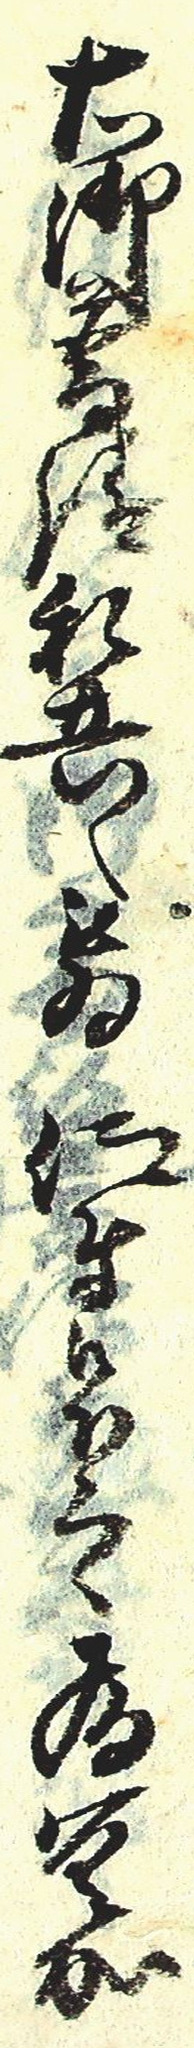右御普請私共へ被為仰付被下候はゝ為冥加
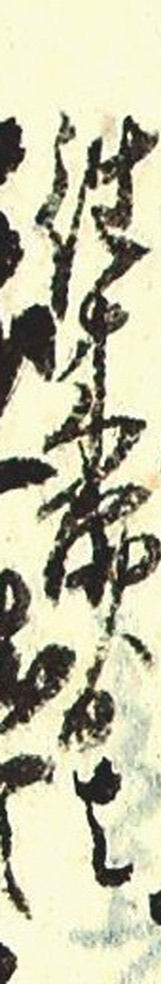往来筋ゟは
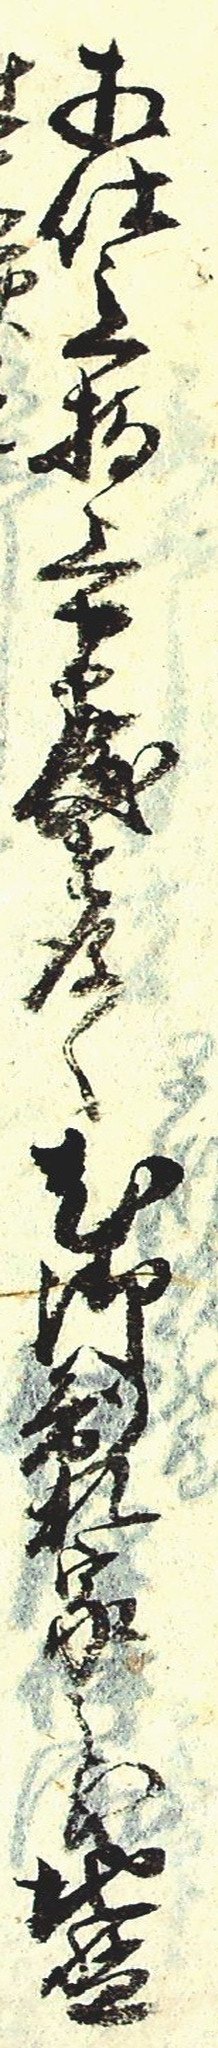相仕立指上申度奉存候尤御制札家之義地盤
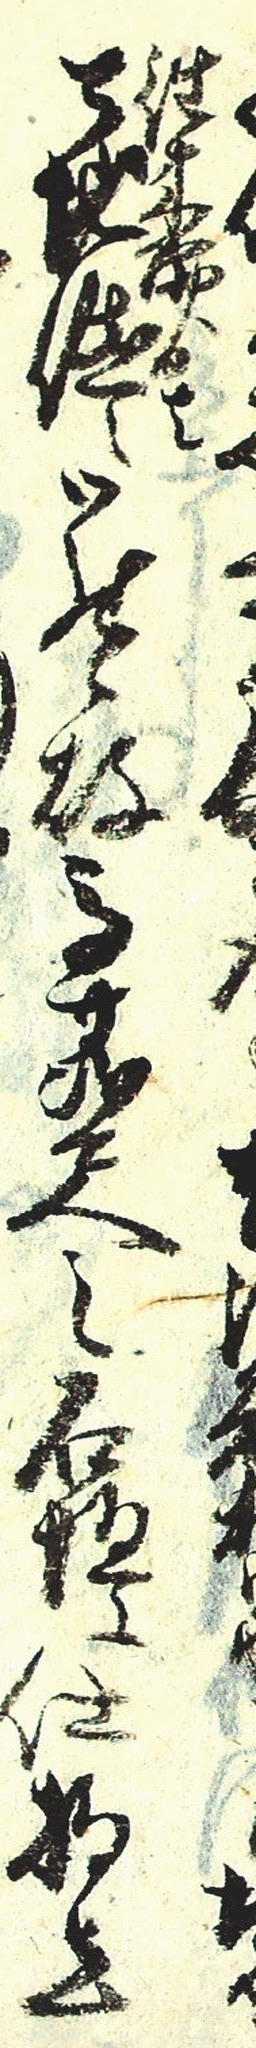土地低に御座候故高さ弐尺之石垣に仕指上
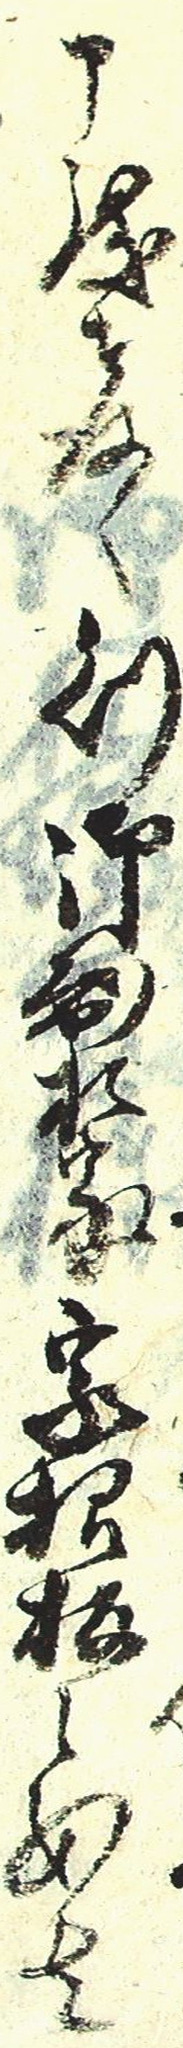申度奉存候則御制札家家根板之義は
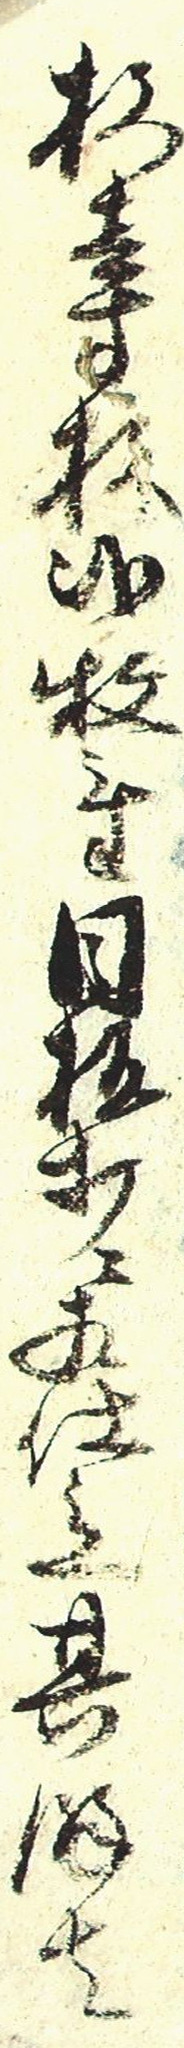杉壱寸板弐枚置目板打に相仕立其余は

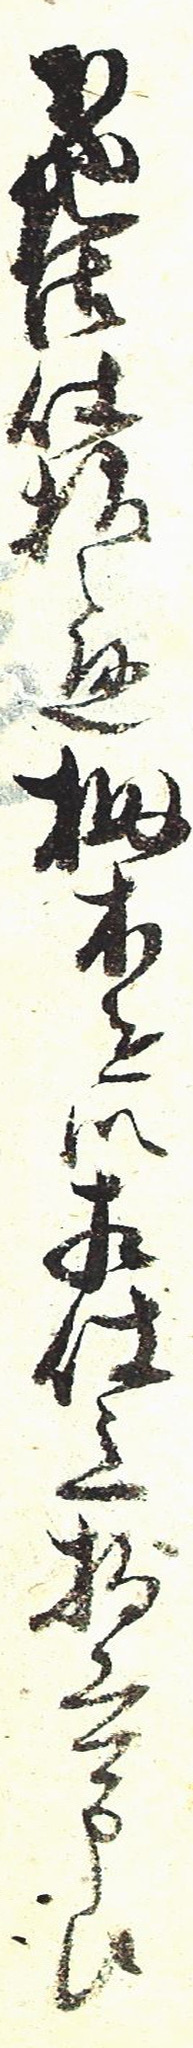下地御仕様之通栂木を以相仕立指上可申候
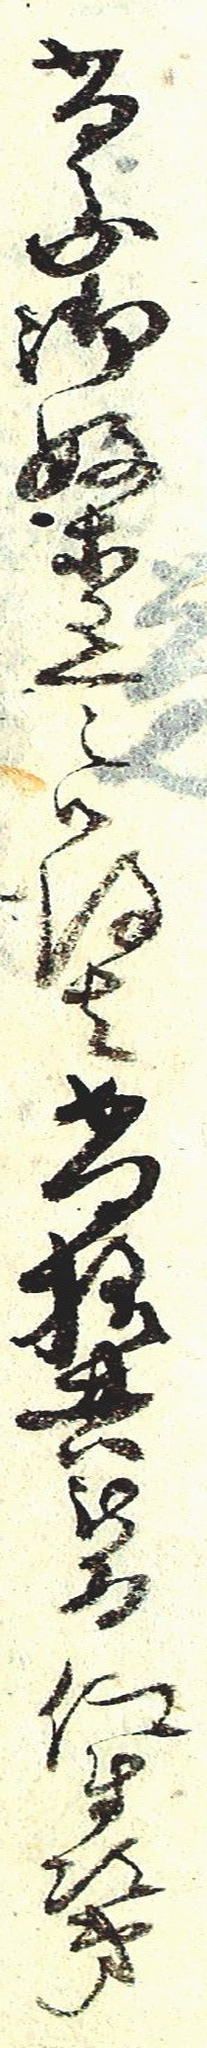尚不御好木有之候得は如何様共被為仰付次第
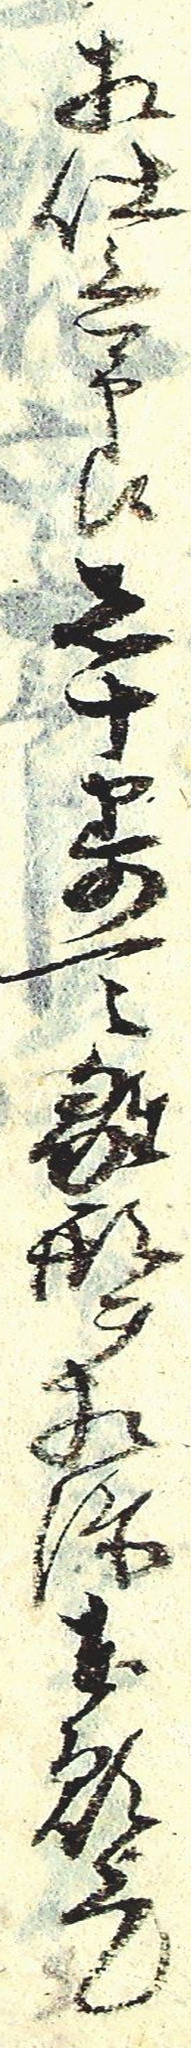相仕立可申候先十歩一之雛形を相添奉願上候
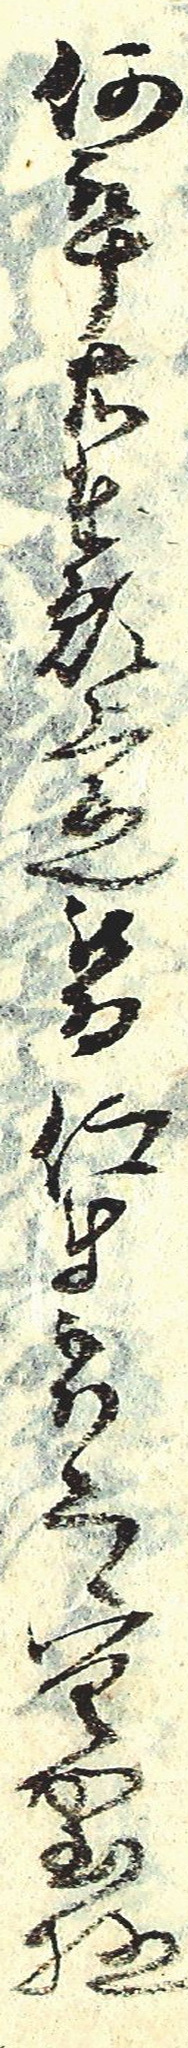何卒右奉願上通被為仰付被下候はゝ冥加至極
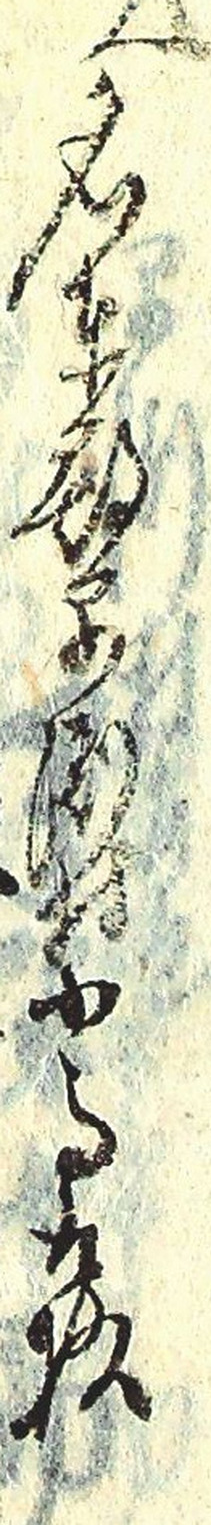名東郡早淵村小高取格
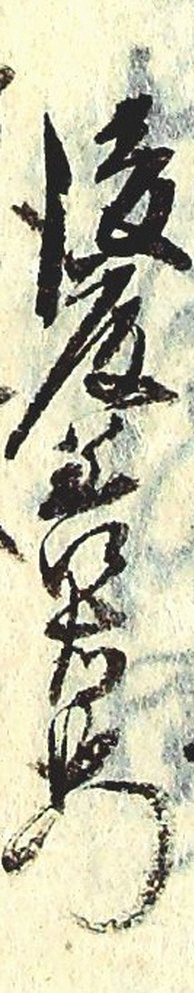後藤善右衛門
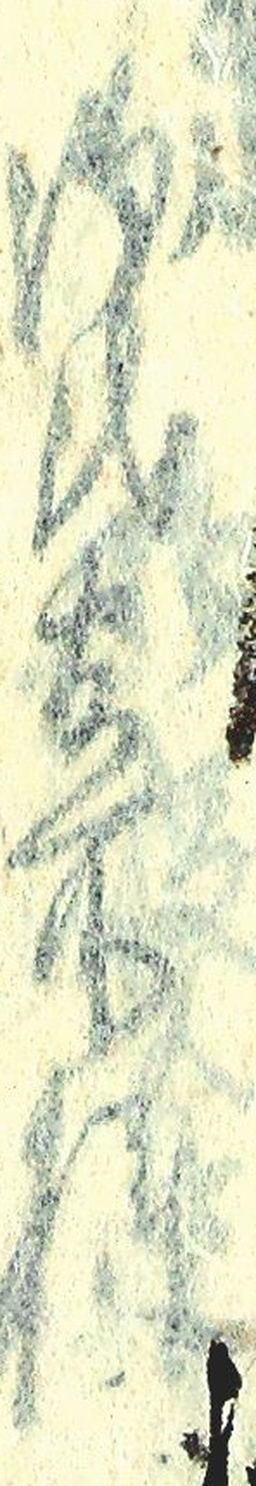御札場所様
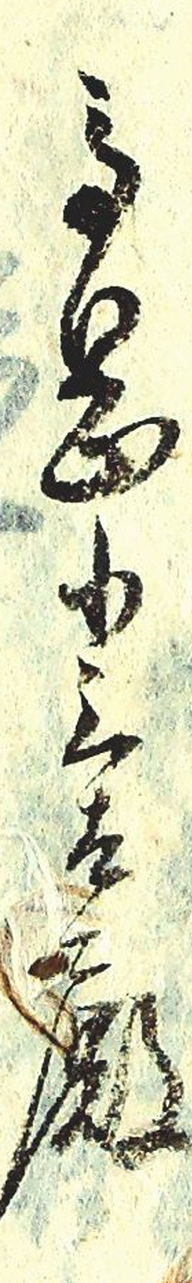高岡小三太殿
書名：諸御願書控(弐番）
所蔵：鳴門教育大学 Naruto University of Education
